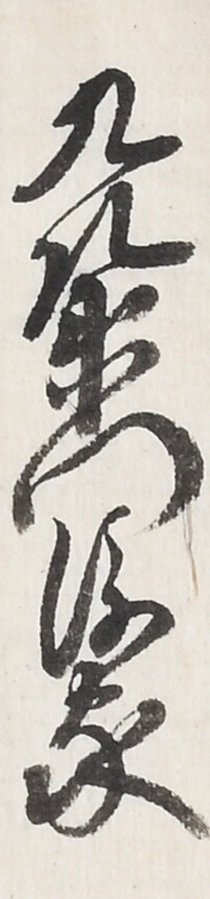九左衛門後家
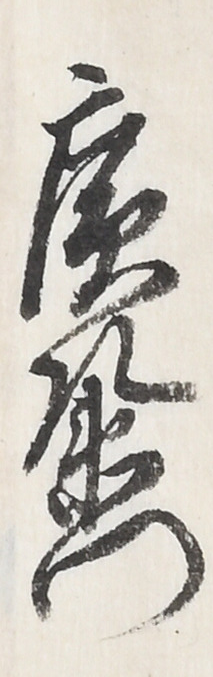広左衛門
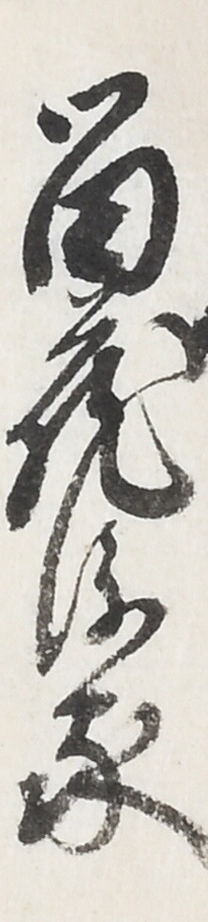留蔵後家
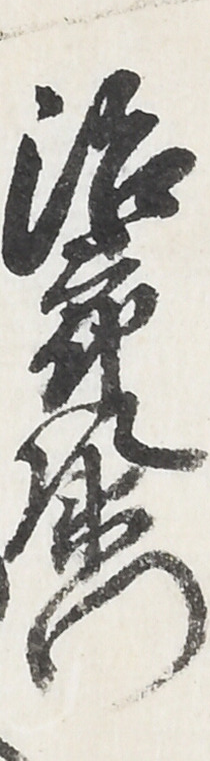治郎左衛門
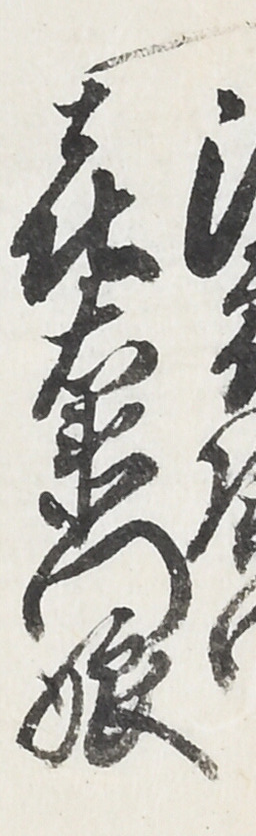喜右衛門娘
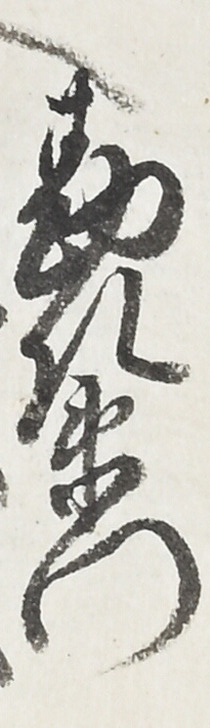勘左衛門
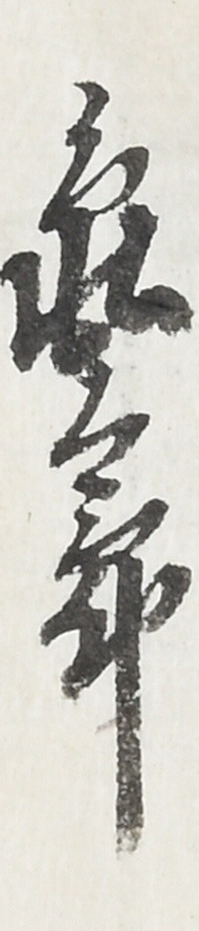亀太郎
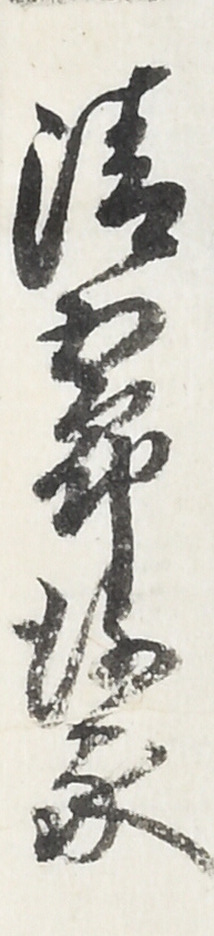清五郎後家

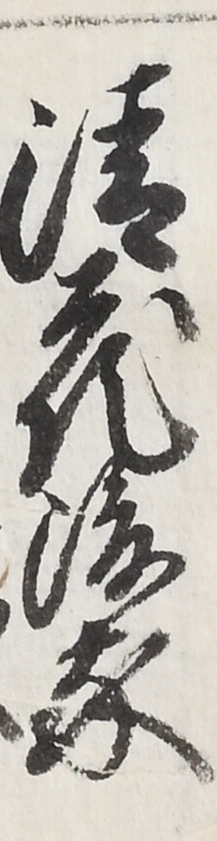清蔵後家
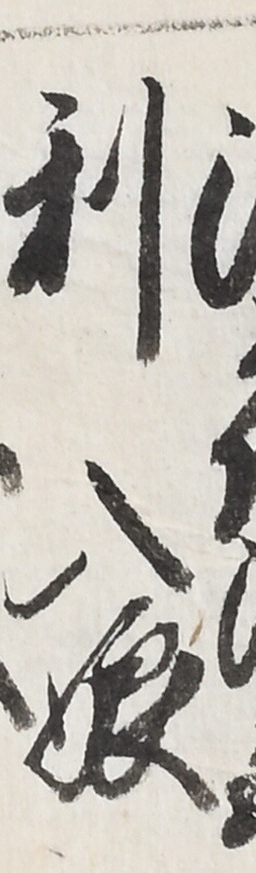利八娘
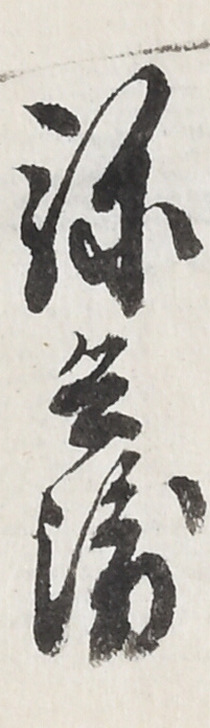弥兵衛
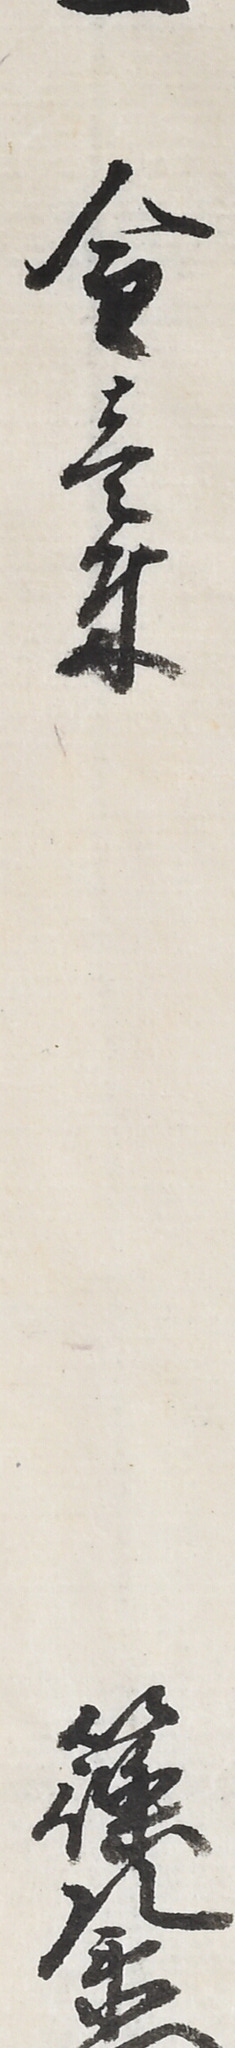一金壱朱篠左衛門
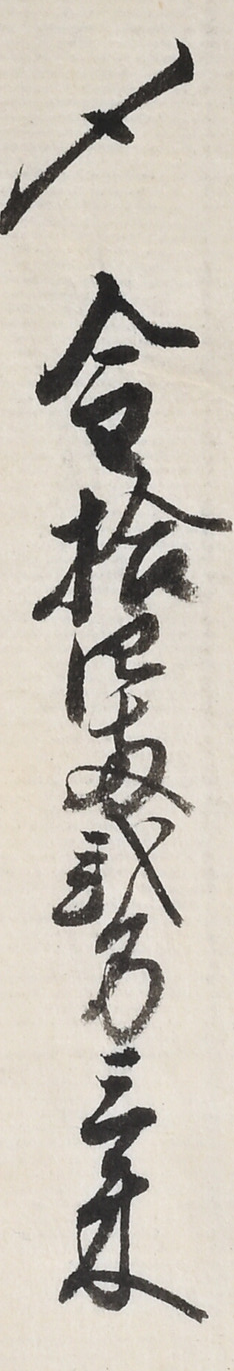〆金拾四両弐分三朱
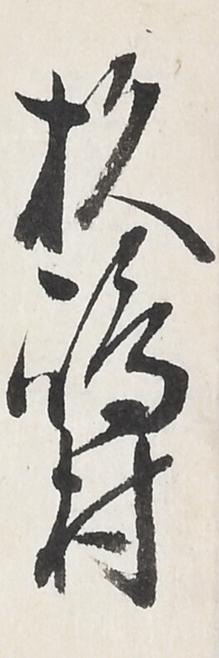杉嶋村
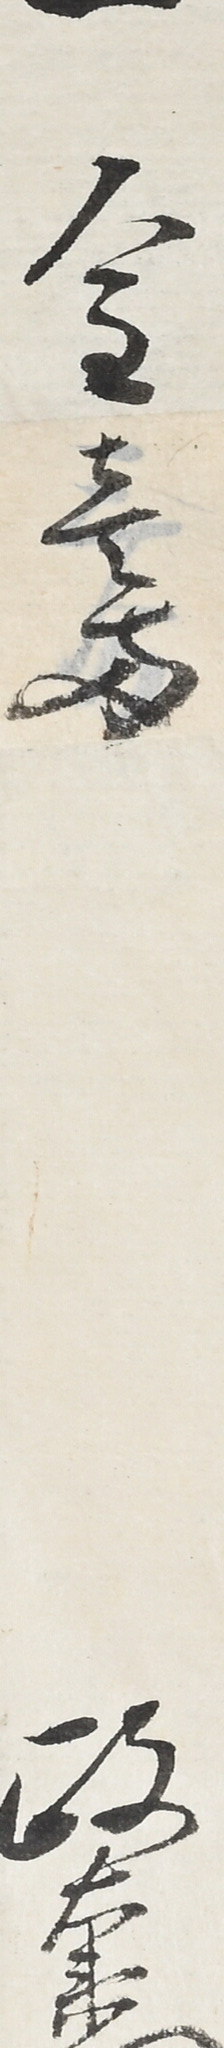一金壱両政右衛門
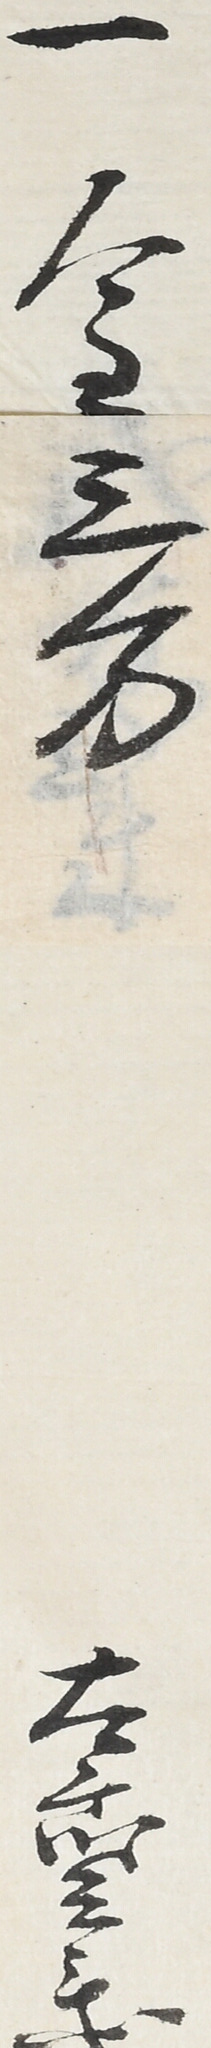一金三分太郎兵衛
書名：御拝地百五拾年御祝儀献上御目録名前
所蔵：伊那市立高遠町図書館・合同会社AMANE
